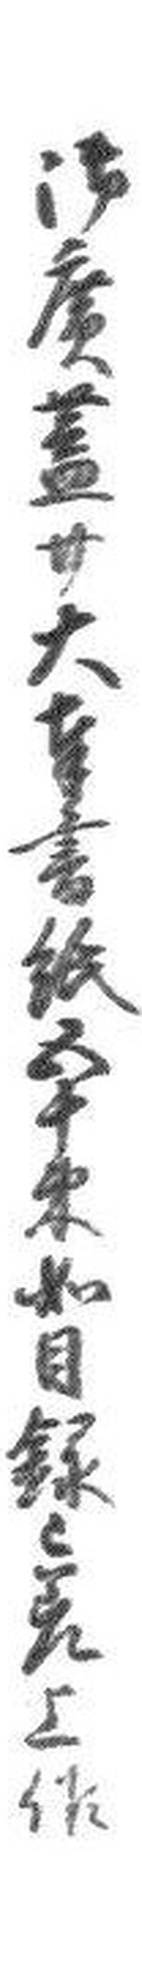御広蓋廿大奉書紙五十束如目録被差上候

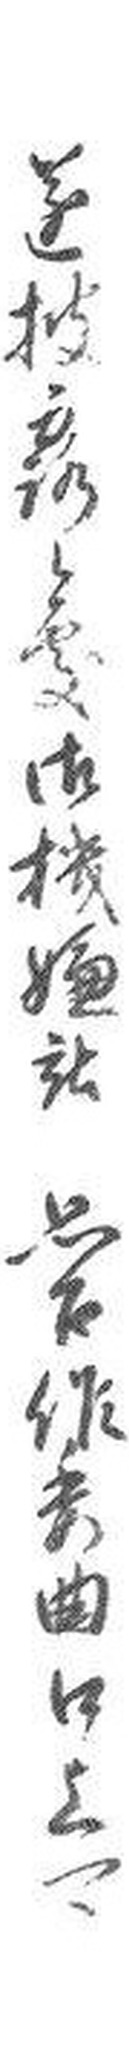遂披露候処御機嫌被思召候委曲口上可
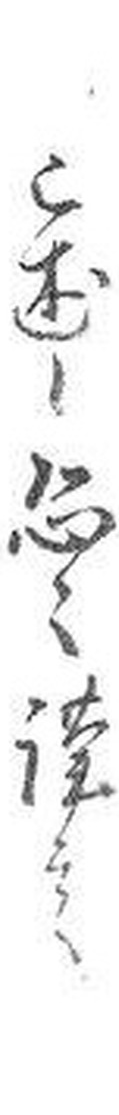被述候恐々謹言
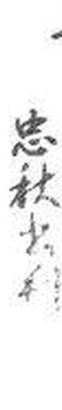忠秋書判
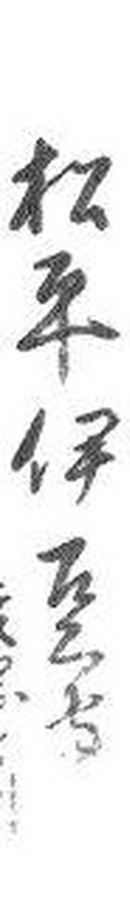松平伊豆守
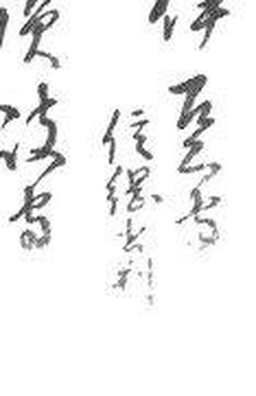信綱書判
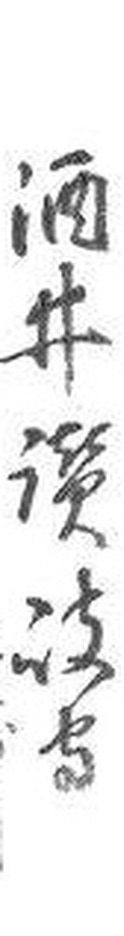酒井讃岐守
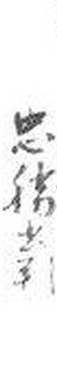忠勝書判
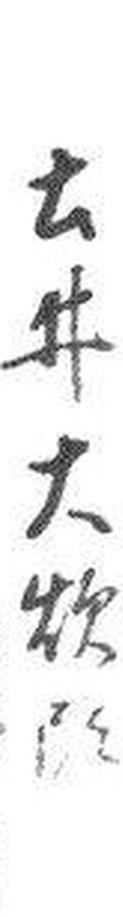土井大炊頭
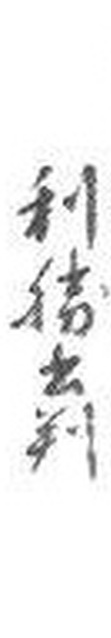利勝書判
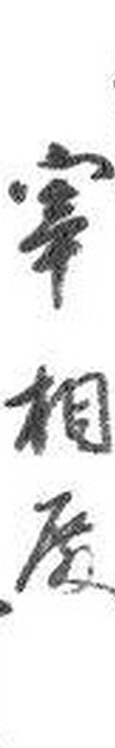宰相殿
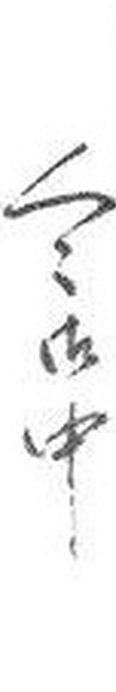人々御中
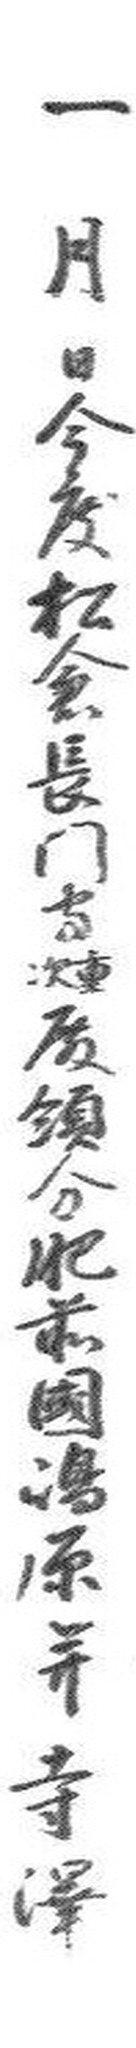一月日今度松倉長門守重次殿領分肥前国島原并寺沢
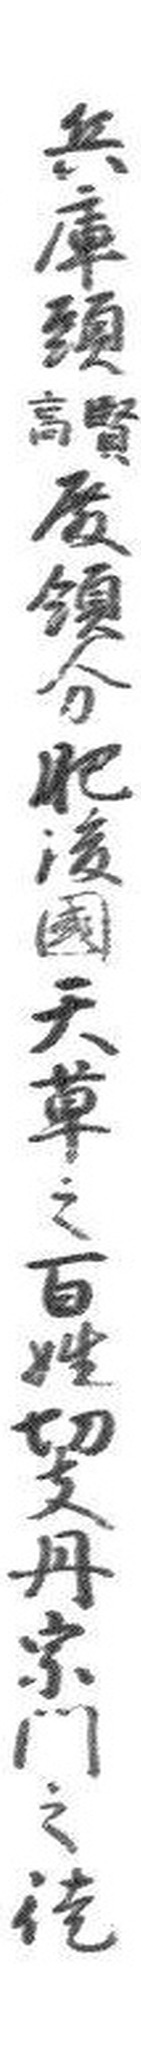兵庫頭賢高殿領分肥後国天草之百姓切支丹宗門之徒
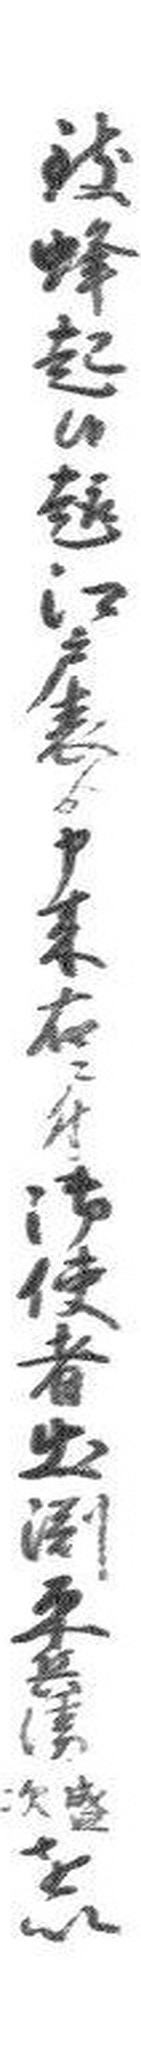致蜂起候趣江戸表ゟ申来右ニ付御使者出渕平兵衛盛次を以
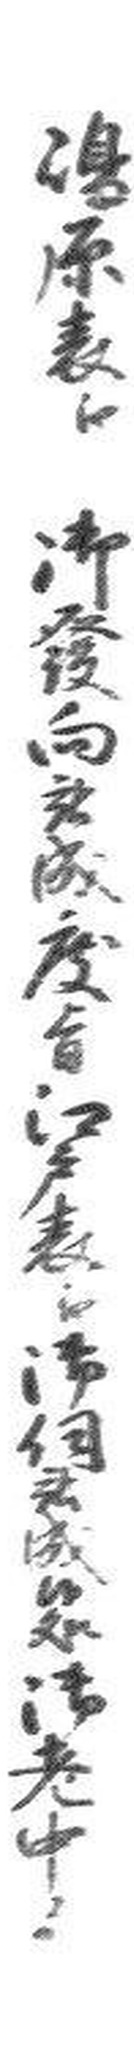島原表江御発向被成度旨江戸表江御伺被成候処御老中ゟ
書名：家譜 四 忠昌公 従寛永七年到正保四年
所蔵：福井県文書館 Fukui Prefectural Archives
